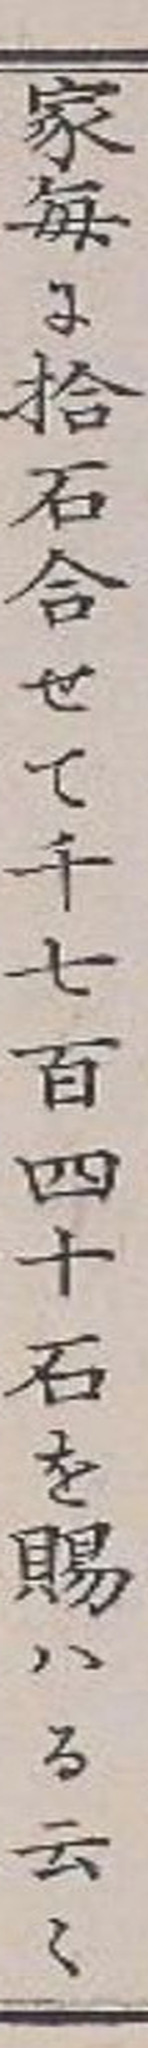家毎に十石合せて千七百四十石を賜はる云々
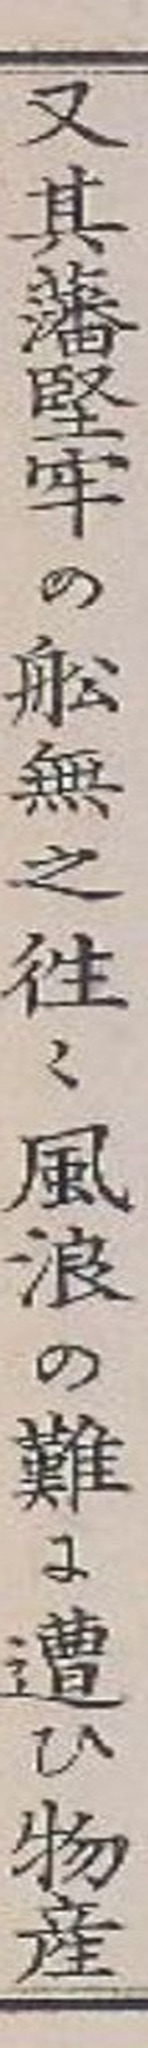又其藩堅牢の船無之往々風浪の難に遭ひ物産
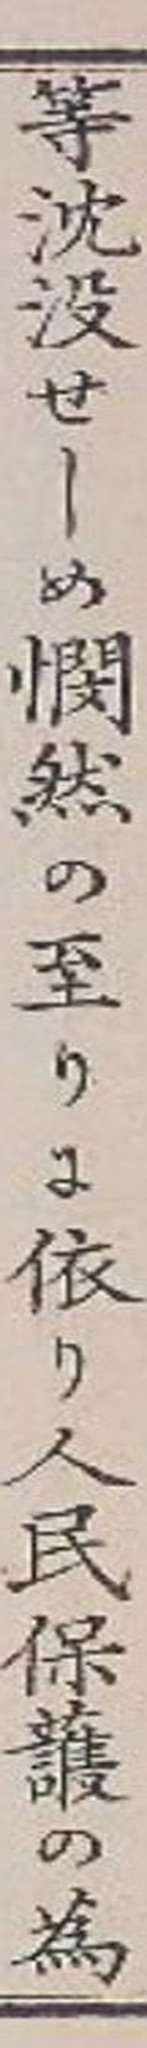等沈没せしめ憫然の至りに依り人民保護の為
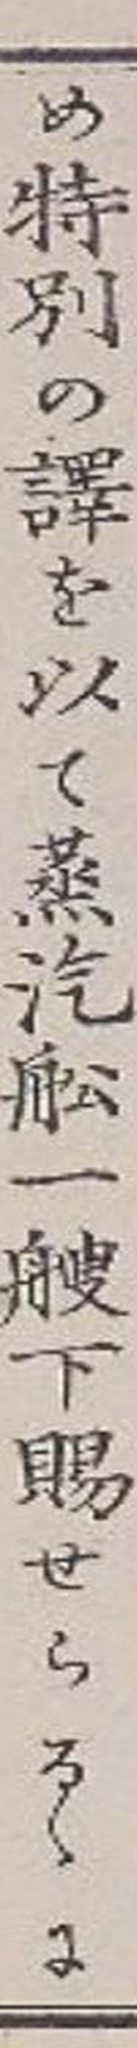め特別の訳を以て蒸気船一艘下賜せらるゝに
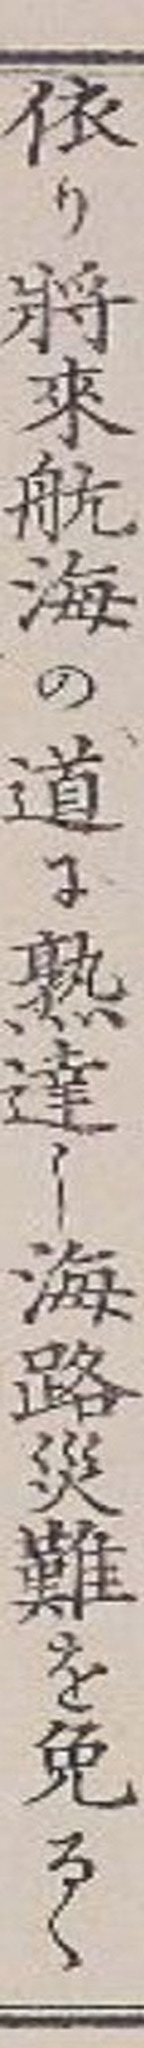依り将来航海の道に熟達し海路災難を免るゝ
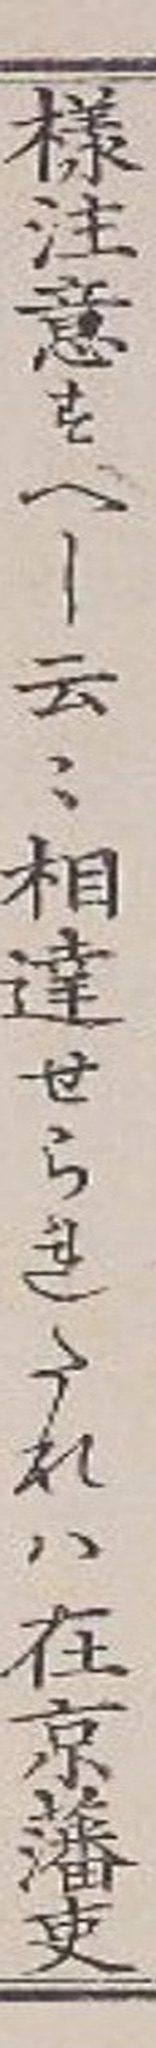様注意すへし云々相達せられたれは在京藩吏
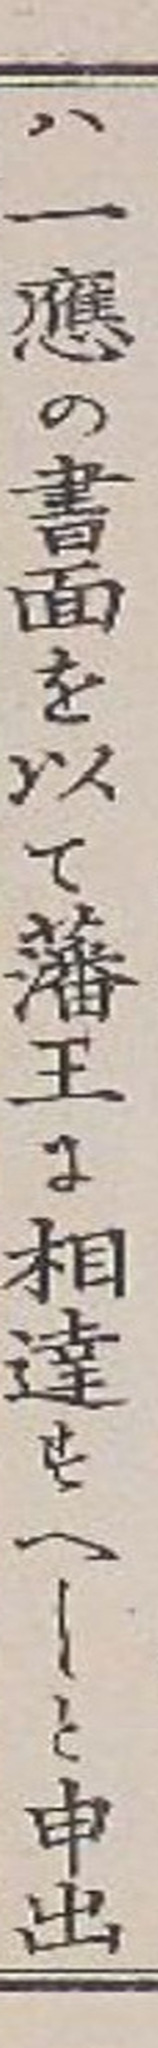は一応の書面を以て藩王に相達すへしと申出
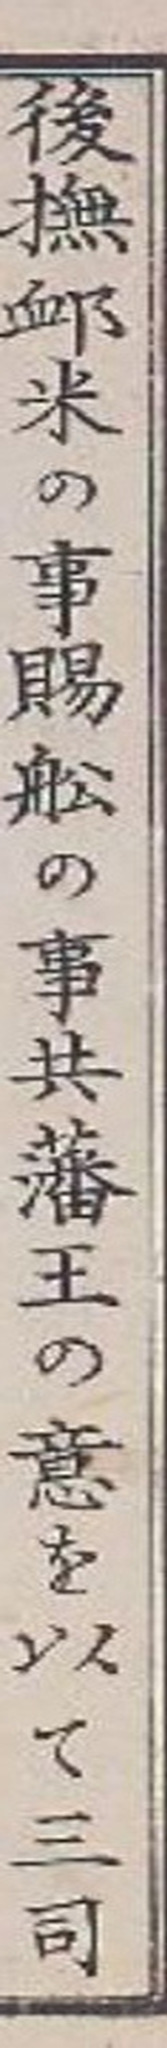後撫卹米の事賜船の事共藩王の意を以て三司
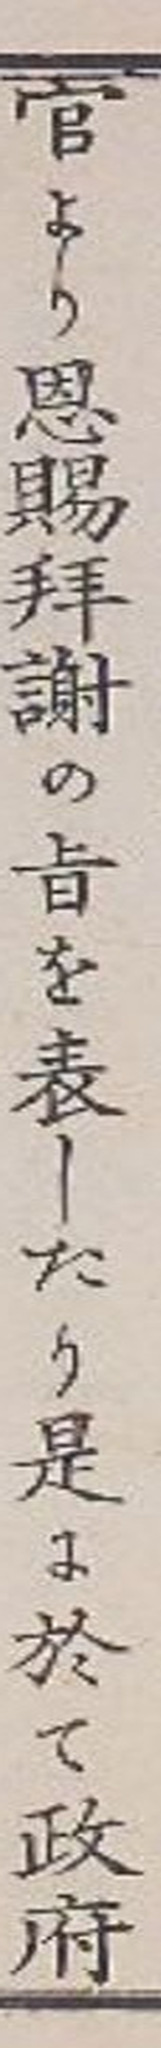官より恩賜拝謝の旨を表したり是に於て政府
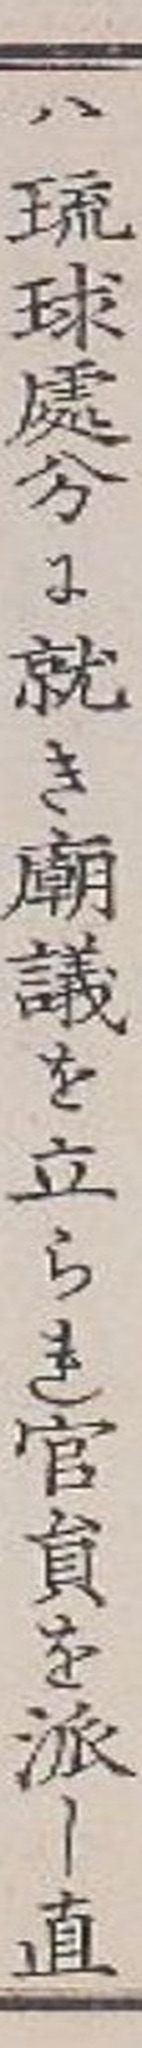は琉球処分に就き廟議を立られ官員を派し直
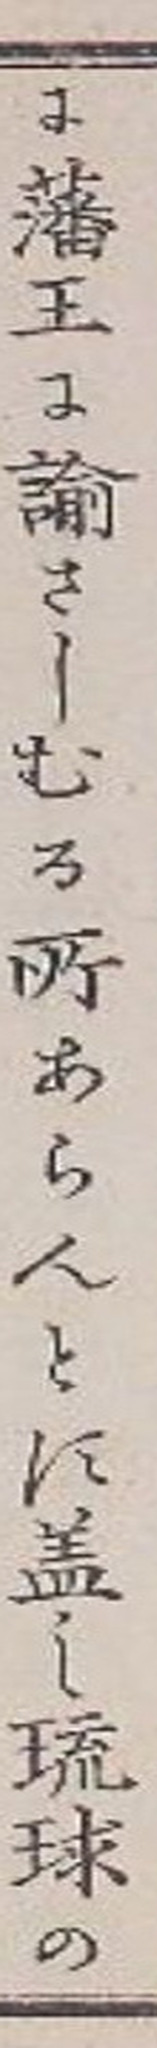に藩王に諭さしむる所あらんとす盖し琉球の
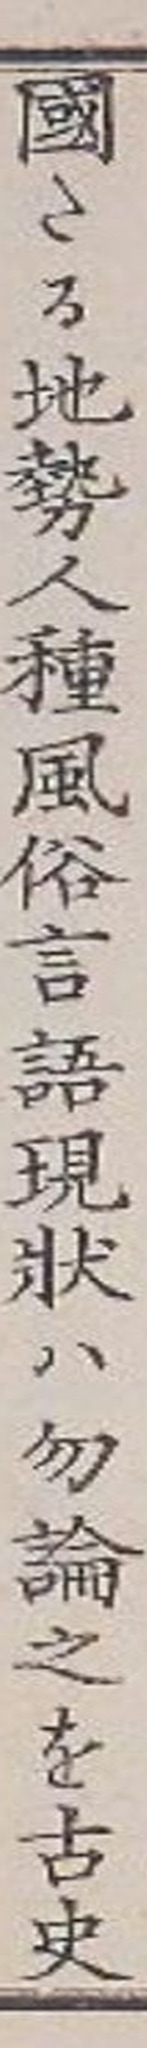国たる地勢人種風俗言語現状は勿論之を古史
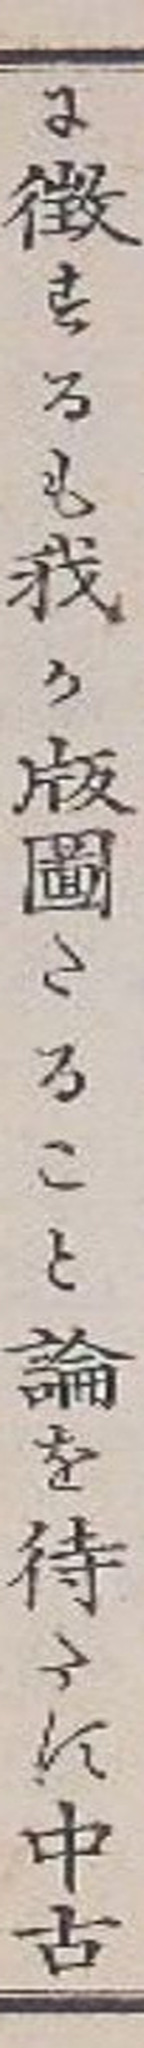に徴するも我か版国たること論を待たす中古
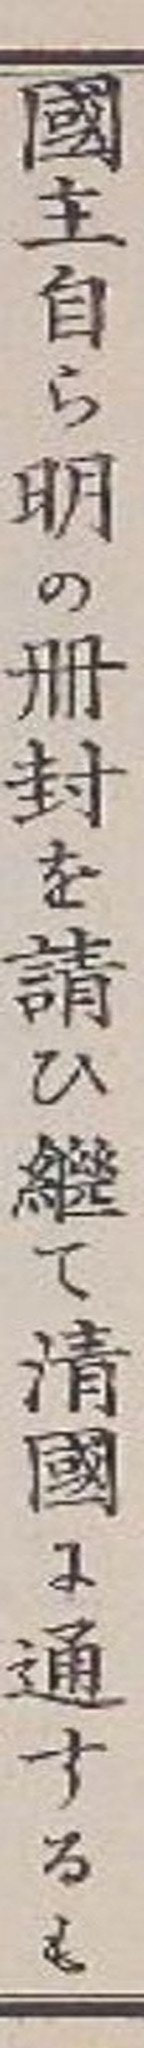国主自ら民の冊封を請ひ継て清国に通するも
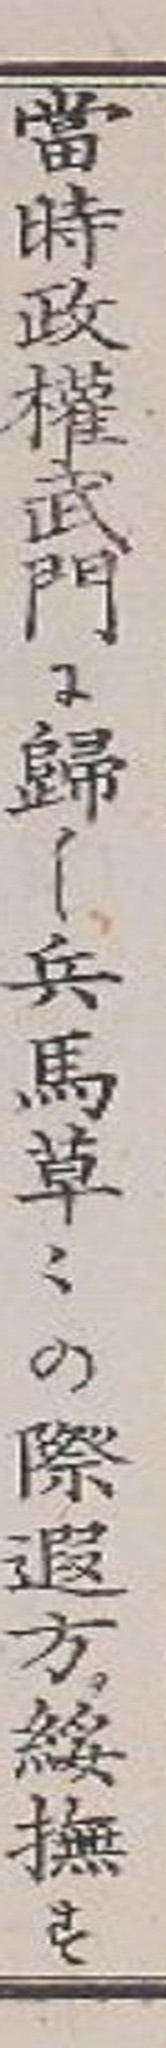常時政権武門に帰し兵馬草々の際遐方綏撫す
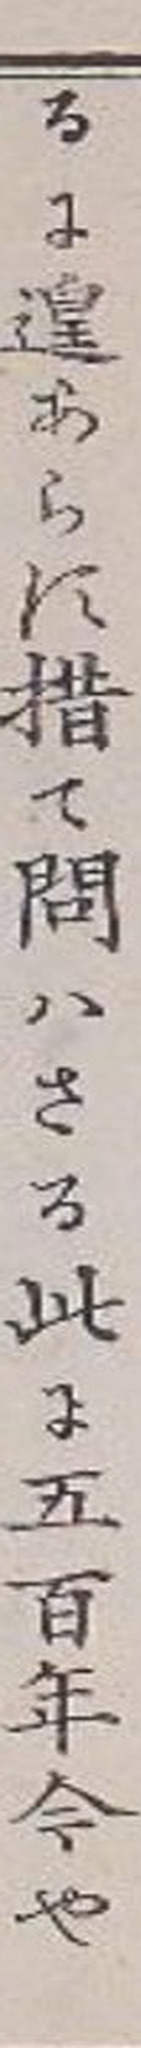るに遑あらす措て問はさる此に五百年今や
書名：南島紀事 下
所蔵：University of the Ryukyus Library
